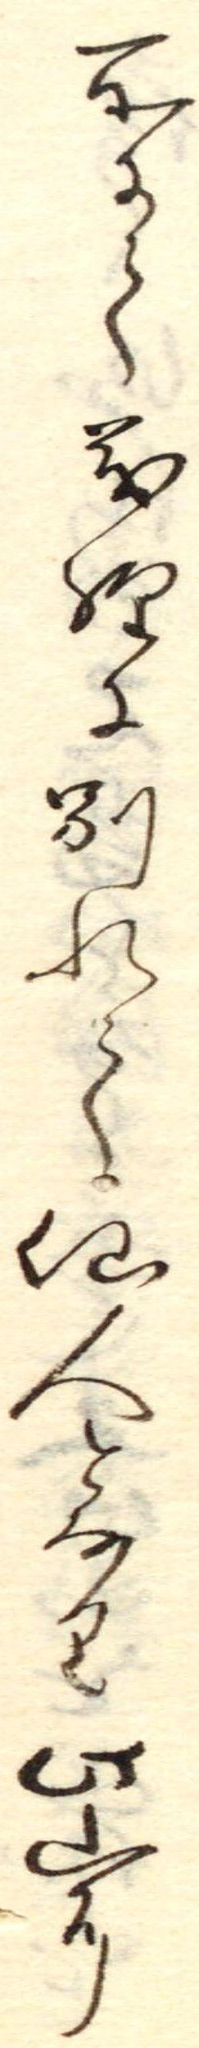所にて義経に別れて仙人となり此山に
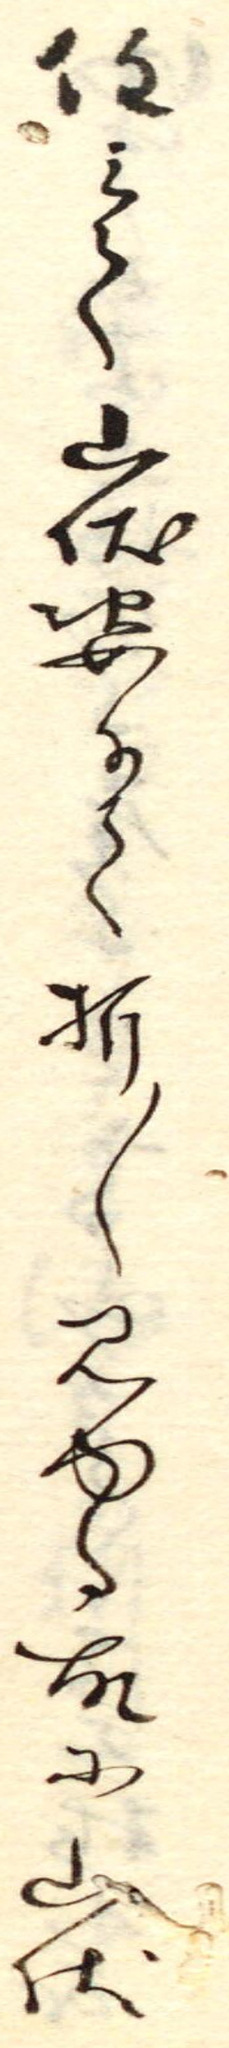住みて山伏姿にて折〳〵見ゆる故に山伏
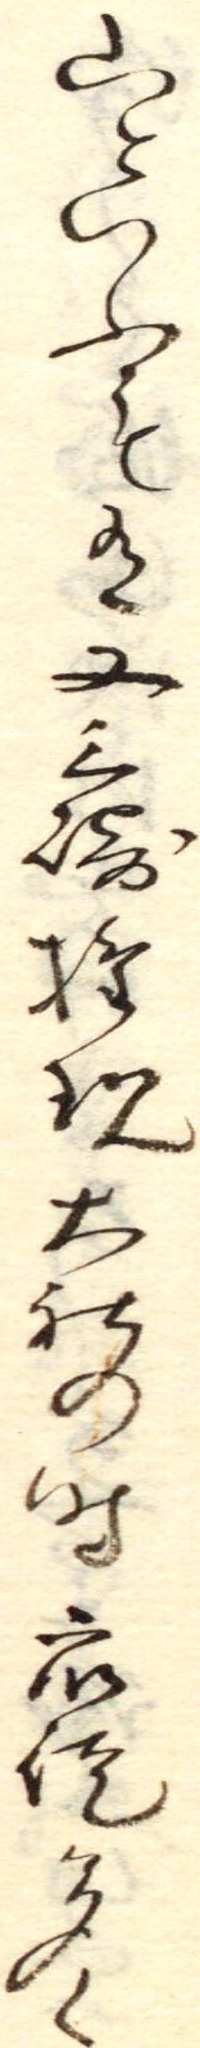山といふも有又三崎権現大社の時衆徒多く
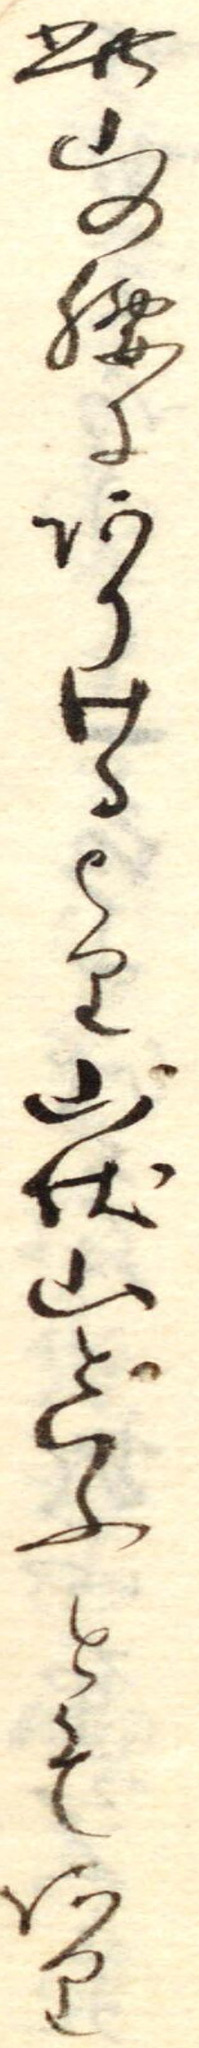此山の腰にありけるより山伏山といふともあり
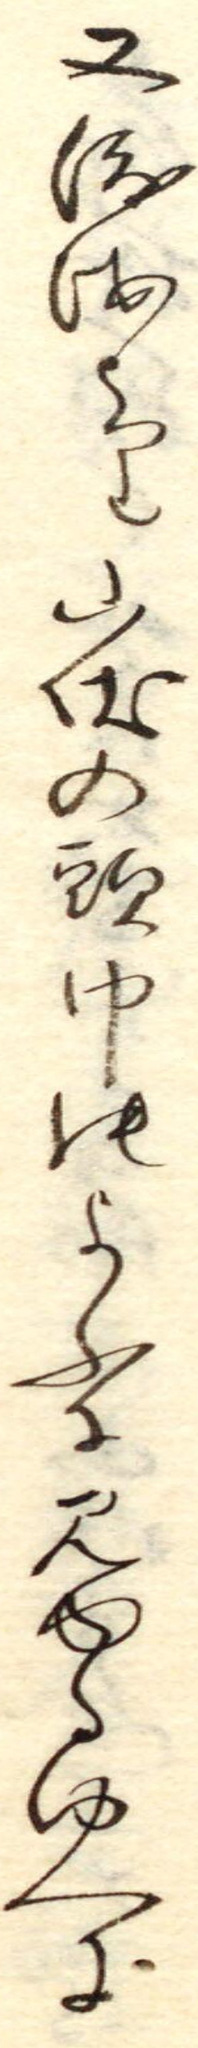又渡海より山伏の頭中のよふに見ゆるゆへに
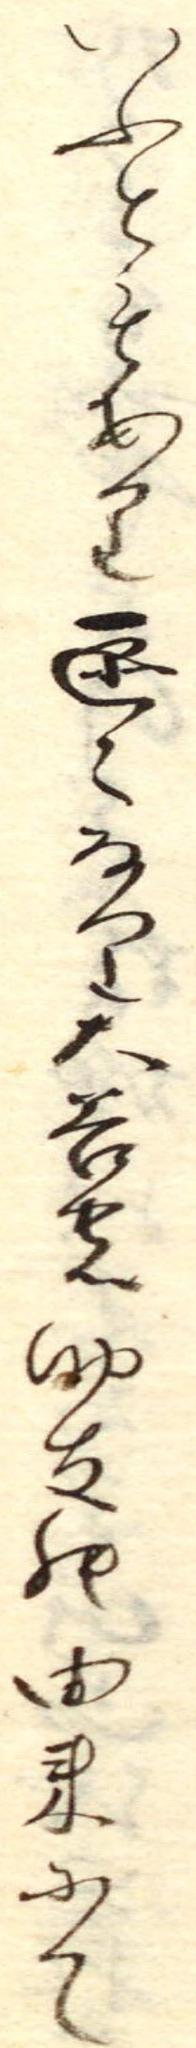いふともあり区々なり大谷の助友の由来にて
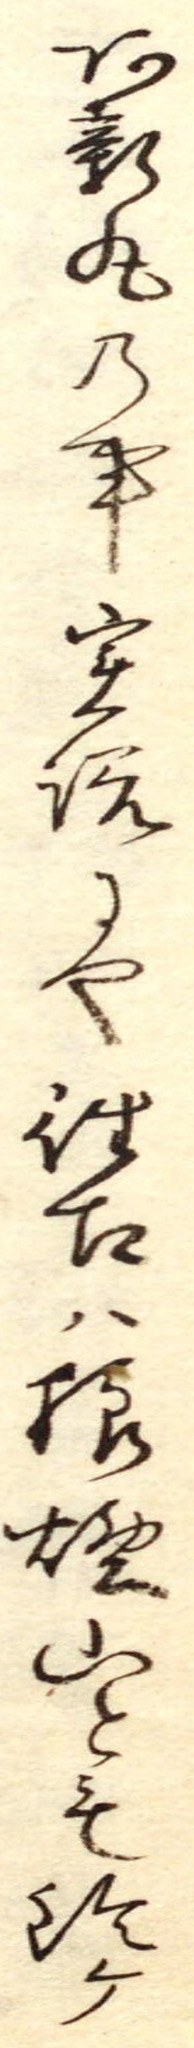阿新丸の事実説にや往古は狼煙とも鈴ヶ
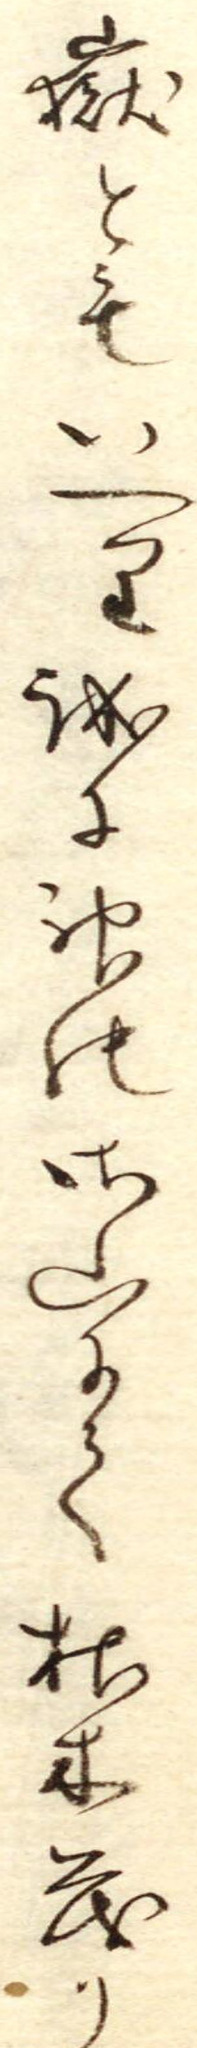嶽ともいへり誠に神の御山にて枯木茂り
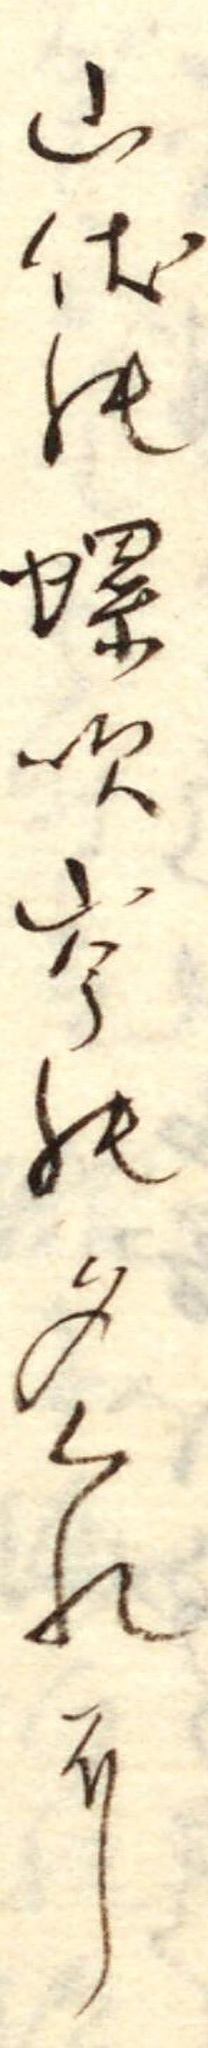山伏の螺吹岑の夕くれに
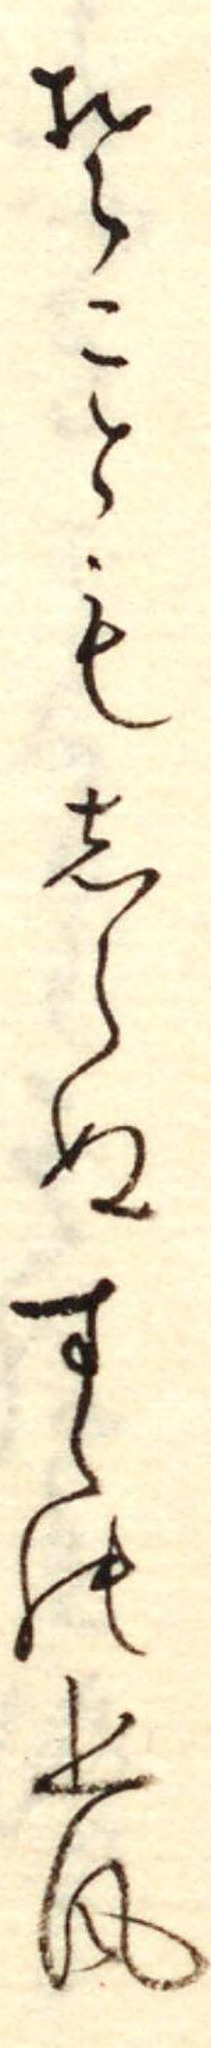そこともしらぬすゝの止風
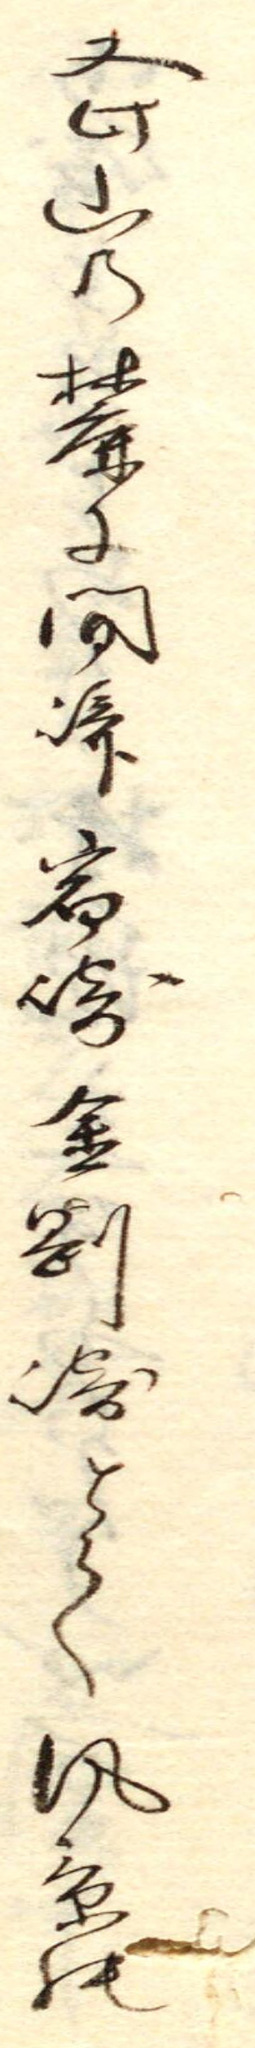又此山の麓に問崎宿崎金剛崎とて風景の
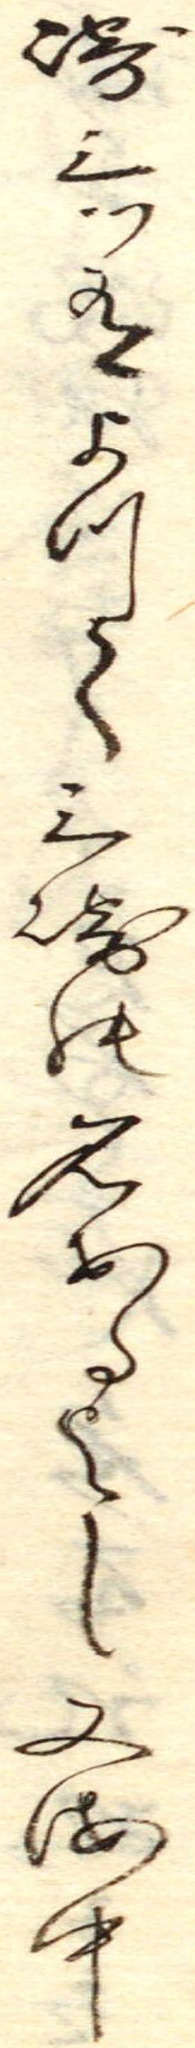崎三ッ有よつて三崎の名あるよし又海中
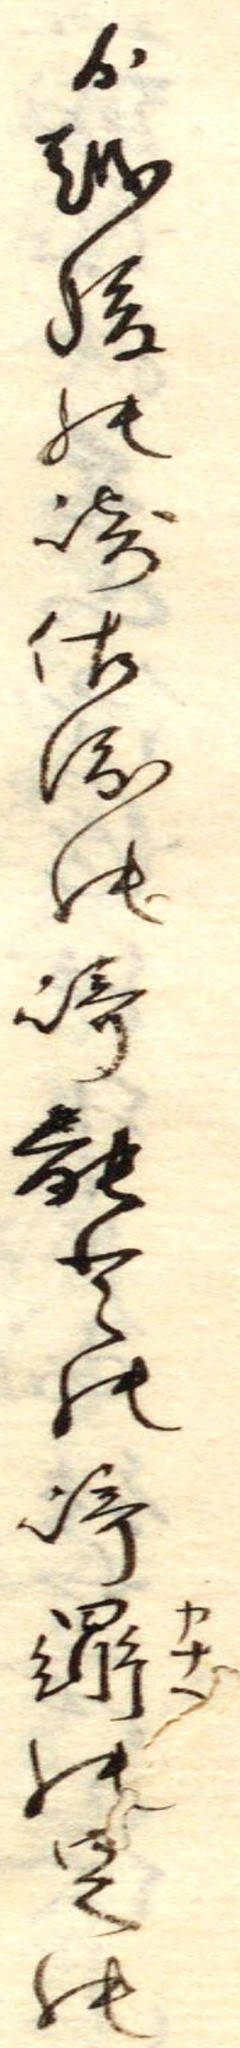ゟ越後の崎佐渡の崎能登の崎鼎の足の
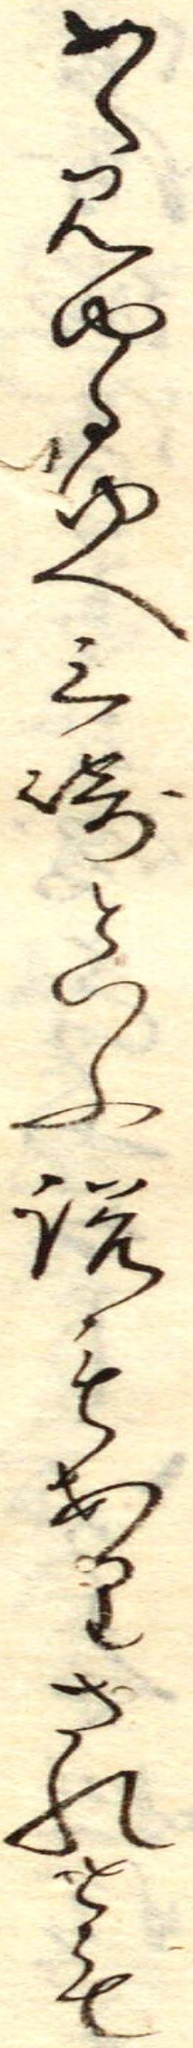如く見ゆるゆへ三崎といふ説もありされとも

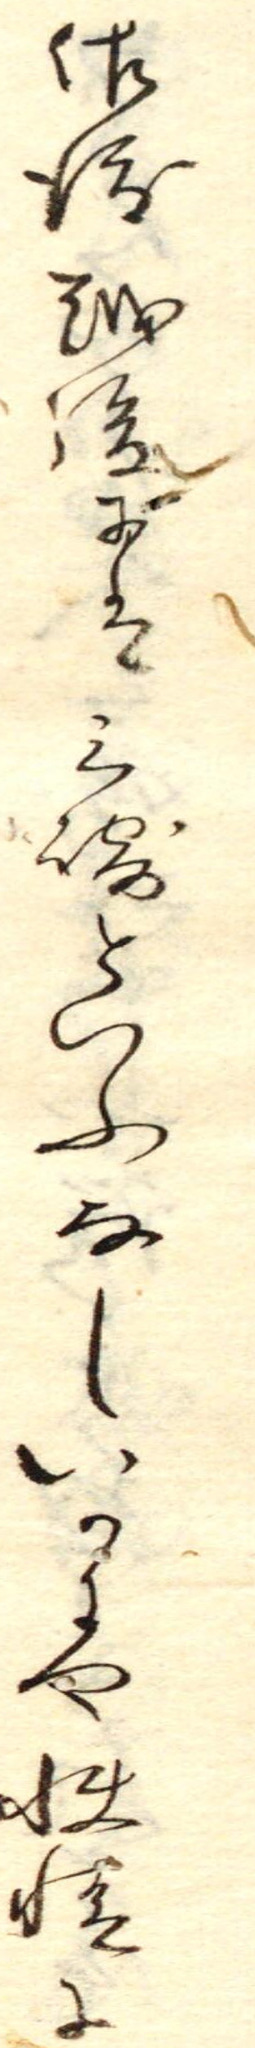佐渡越後には三崎といふなしいかにやに
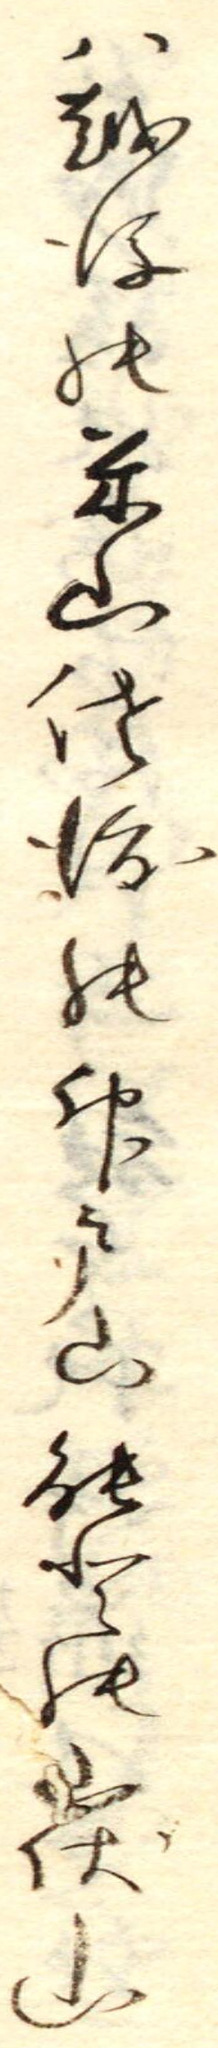は越後の米山佐渡の神戸山能登の山伏山
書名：能登名跡誌
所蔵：Ishikawa Prefectural Library
